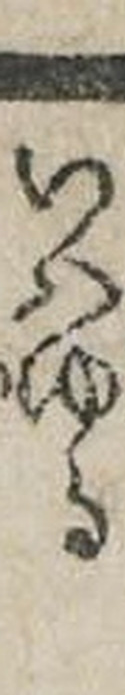いはゆる
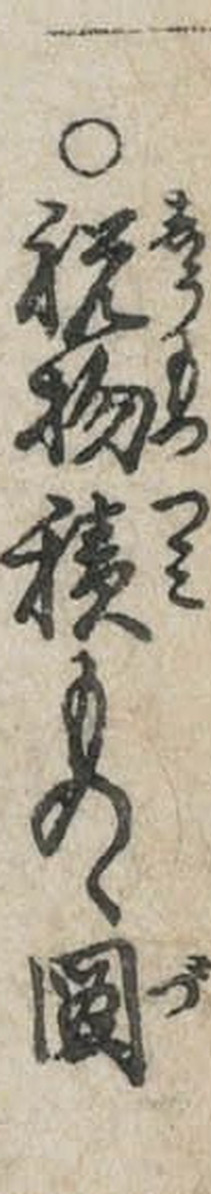○祝物積ものゝ図
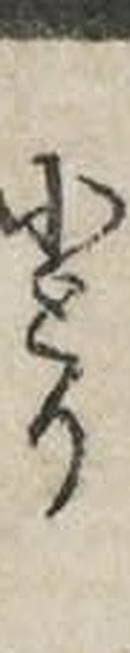小とり
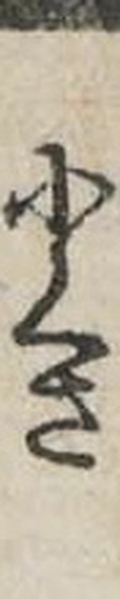小くさ
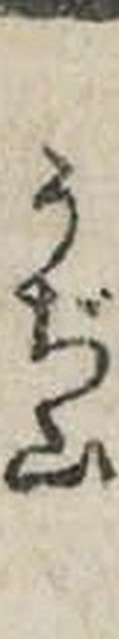うぢ山
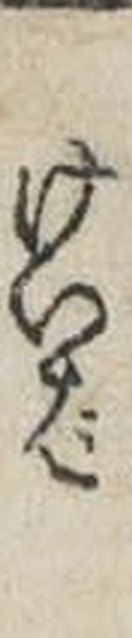けいば
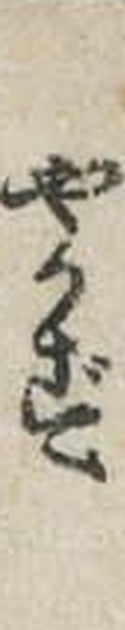やかず
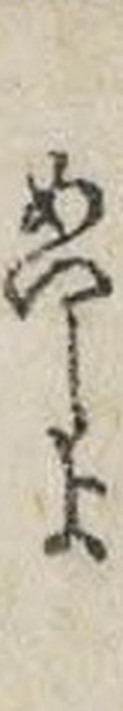めいしよ
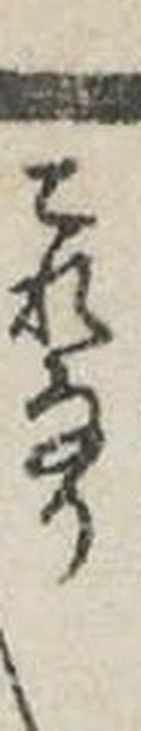これなり
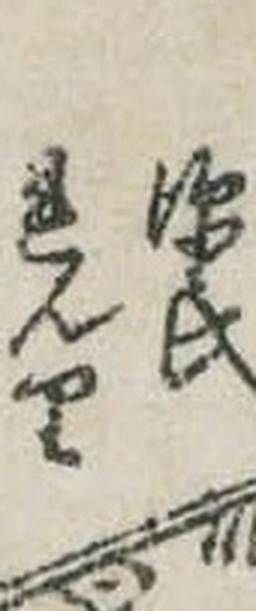れんり
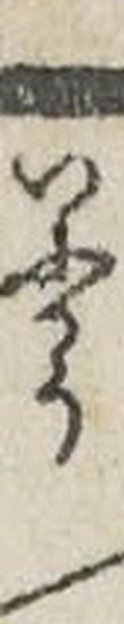いふかう
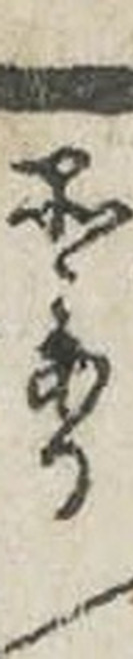品々あり
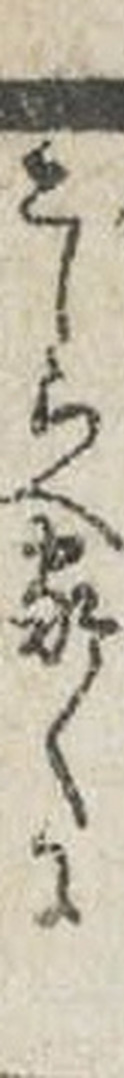こしらへ家〳〵に
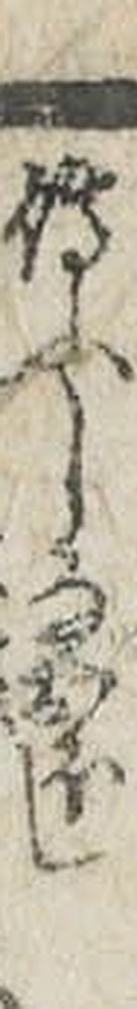伝ふしなおほし
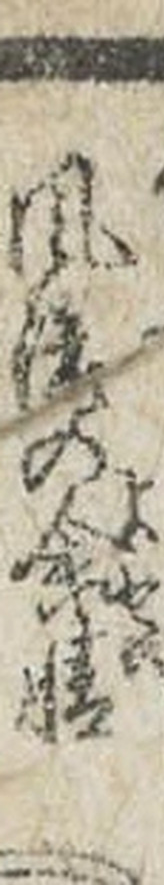風流の余情
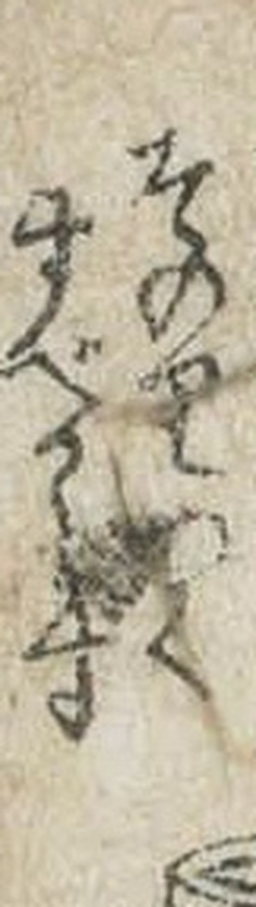すべからず
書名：頭書萬用婦人手紙之文言
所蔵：東京学芸大学教育コンテンツアーカイブ
